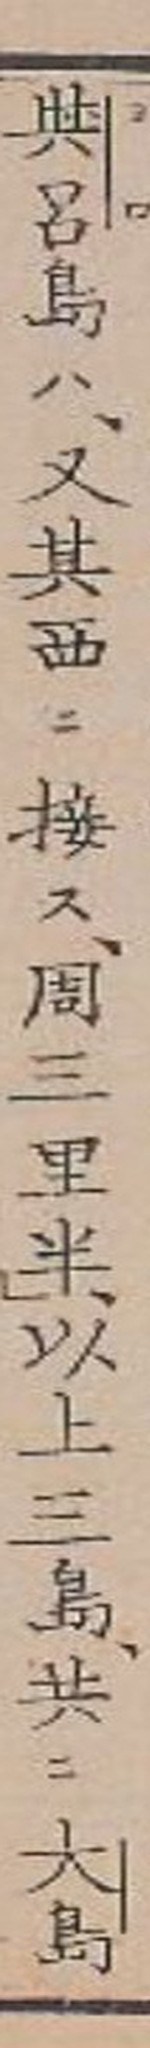与呂島ハ、又其西ニ接ス、周三里半、」以上三島、共ニ大島
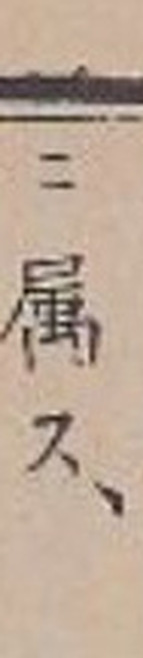ニ属ス、
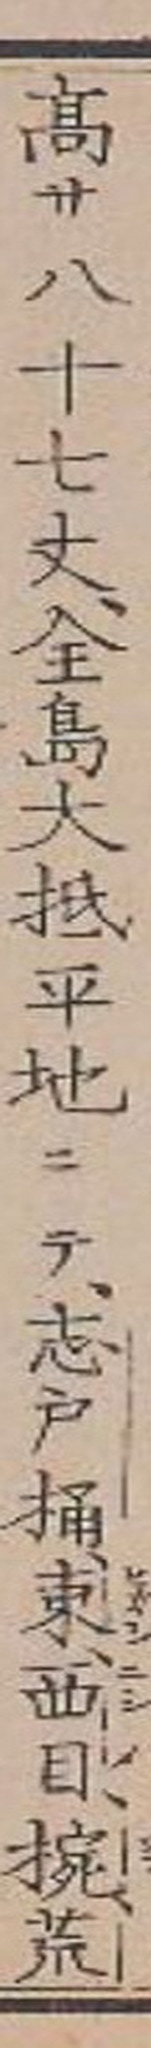高サ八十七丈、全島大抵平地ニテ、志戸桶、東、西目、椀、荒
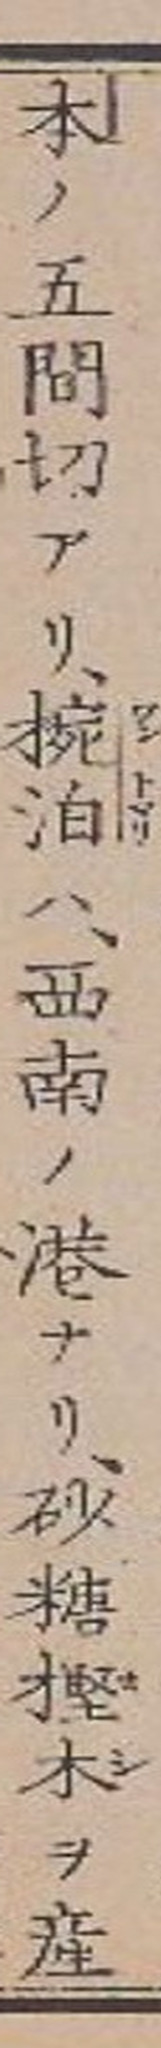本ノ五間切アリ、椀泊ハ、西南ノ港ナリ、砂糖樫木ヲ産
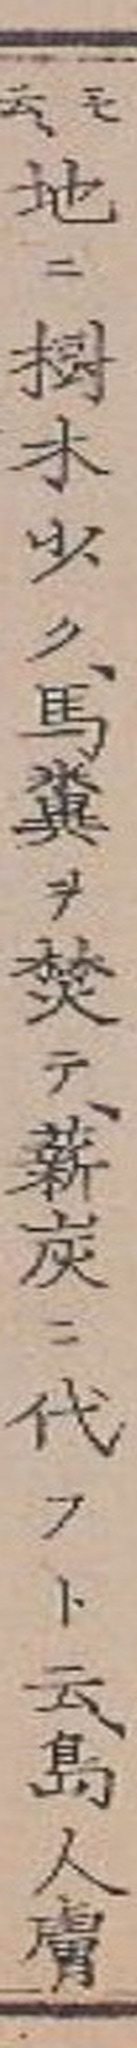モ云、地ニ樹木少ク、馬糞ヲ焚テ、薪炭ニ代フト云、島人膚
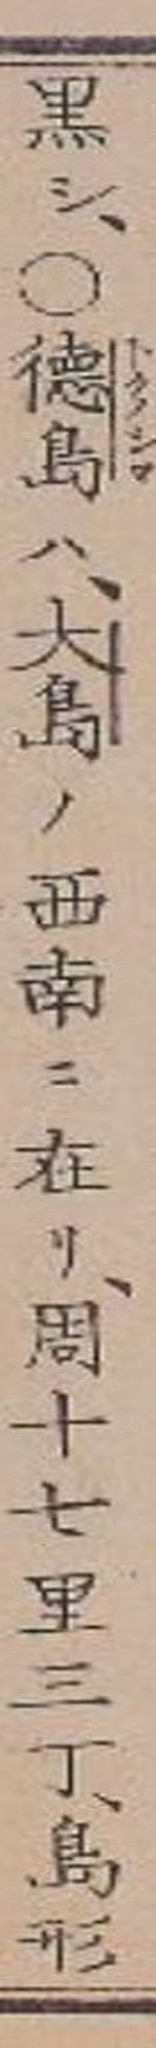黒シ、○徳島ハ、大島ノ西南ニ在リ、周十七里三丁、島形
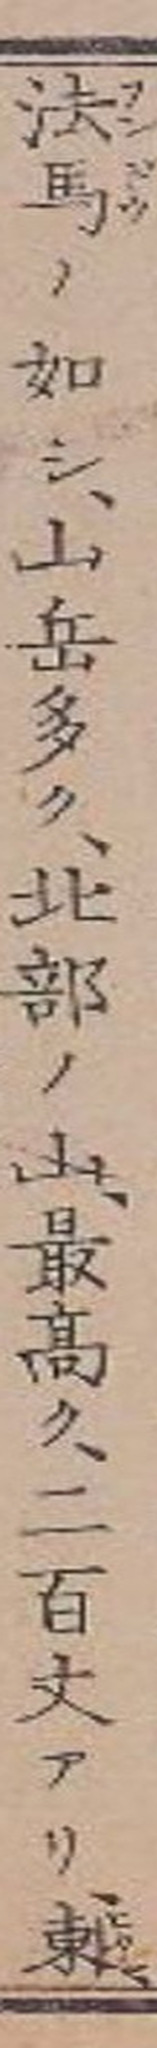法馬ノ如シ、山岳多ク、北部ノ山、最高ク、二百丈アリ、東、
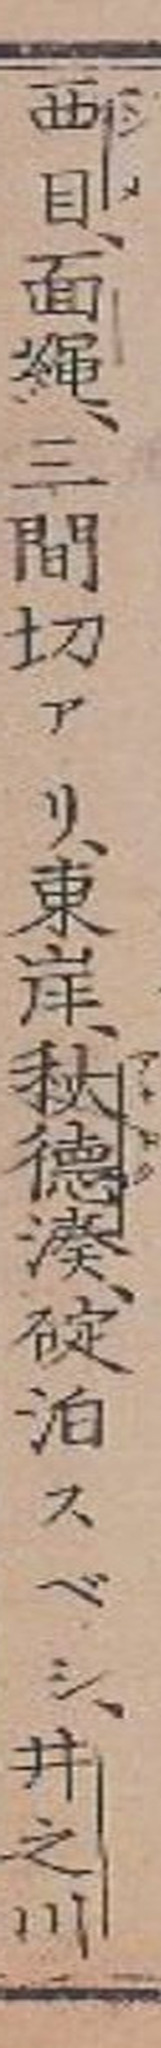西目、面縄、三間切アリ、東岸、秋徳湊、碇泊スベシ、井之川

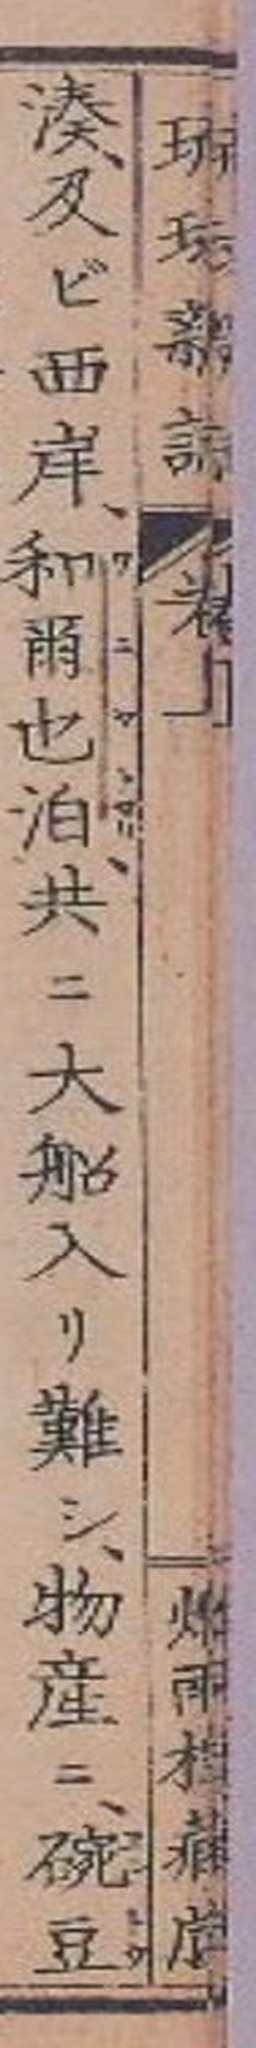湊、及ビ西岸、和爾也泊、共ニ大船入リ難シ、物産ニ、碗豆
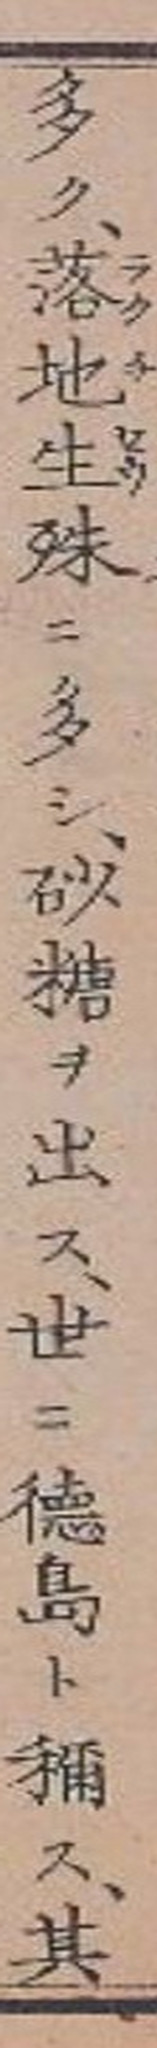多ク、落地生殊ニ多シ、砂糖ヲ出ス、世ニ徳島ト称ス、其
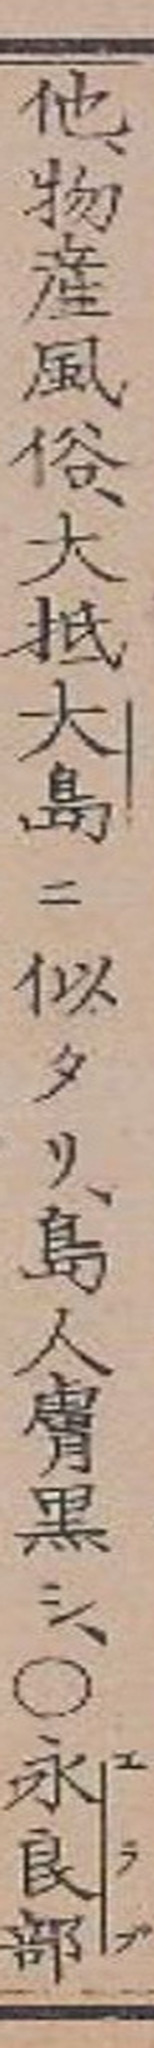他、物産風俗、大抵大島ニ似タリ、島人膚黒シ、○永良部
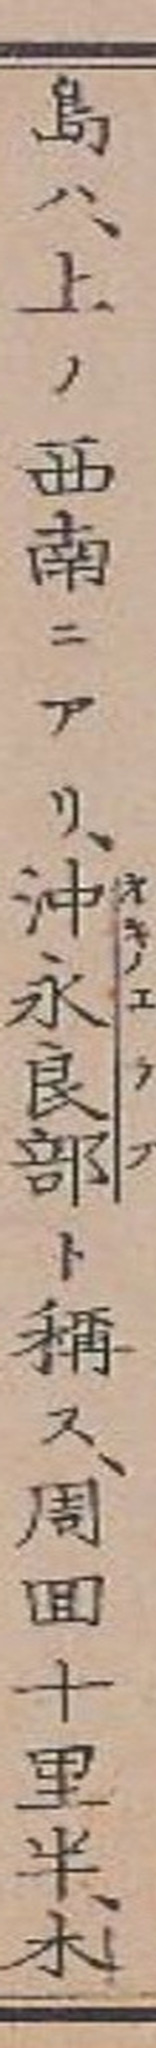島ハ、上ノ西南ニアリ、沖永良部ト称ス、周回十里半、木
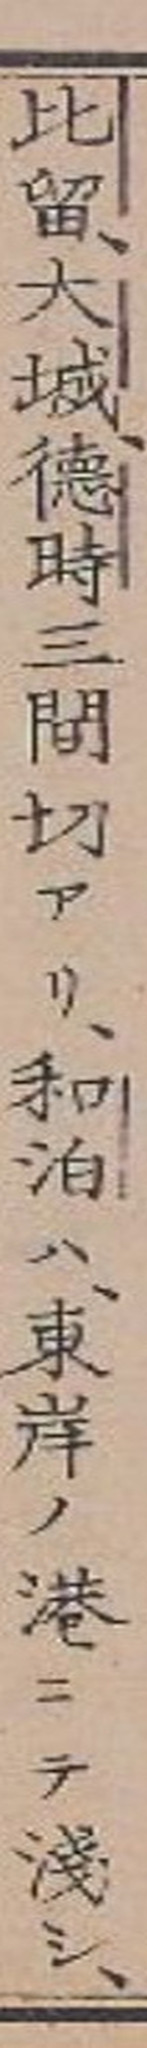比留、大城、徳時三間切アリ、和泊ハ、東岸ノ港ニテ浅シ、
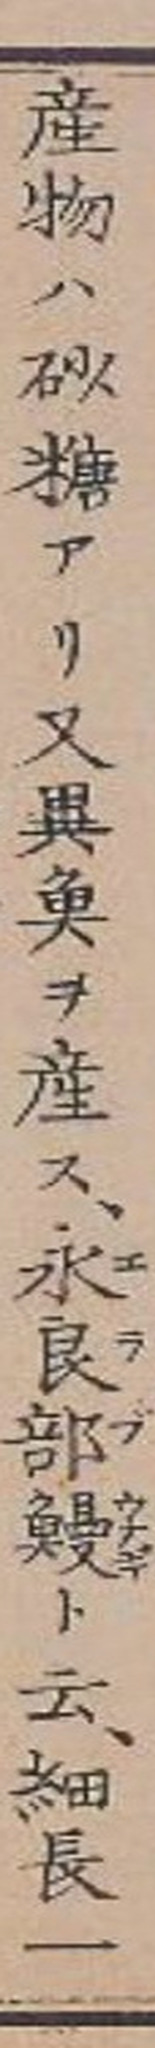産物ハ砂糖アリ又異魚ヲ産ス、永良部鰻ト云、細長一
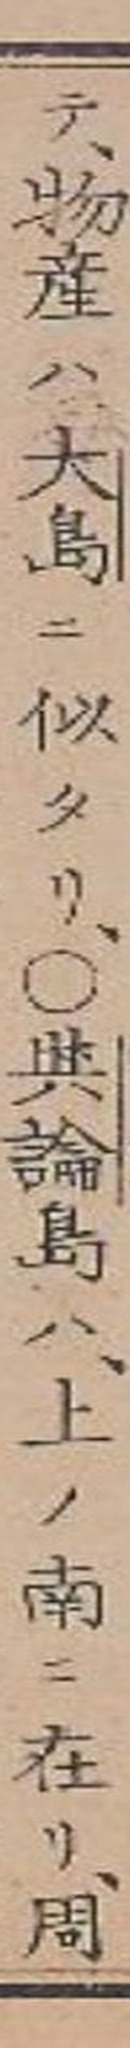テ、物産ハ大島ニ似タリ、○与論島ハ、上ノ南ニ在リ、周
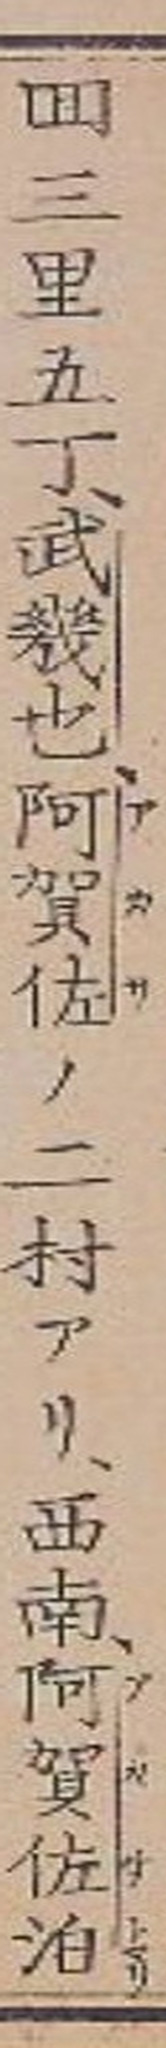回三里五丁、武幾也、阿賀佐ノ二村アリ、西南、阿賀佐泊
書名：琉球新誌 巻上
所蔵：University of the Ryukyus Library
